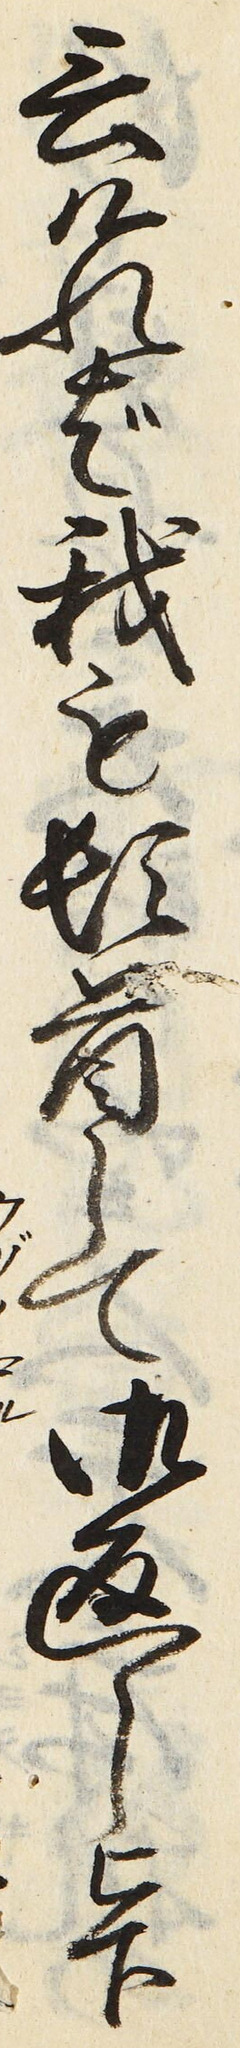云ければ我も頓首して御返し被下
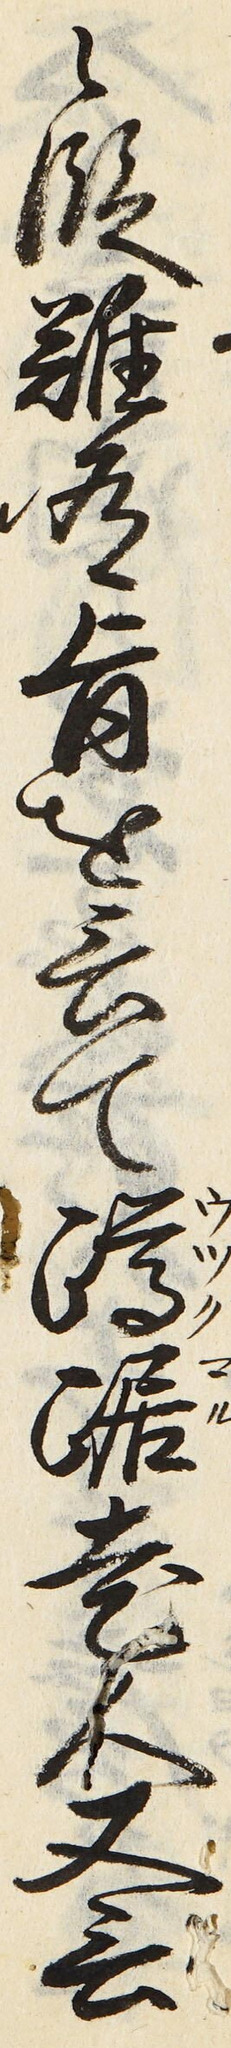候段難有旨を云て蹲踞老人又云
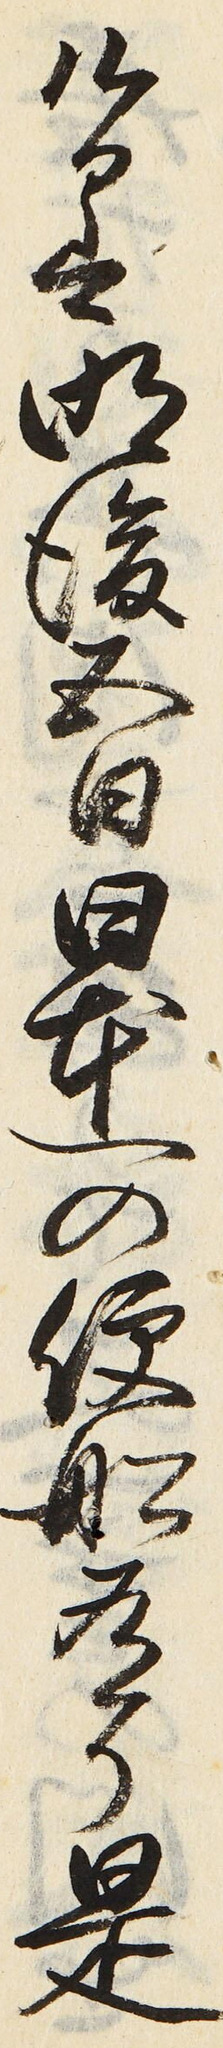けるは明後五日日本への便船有り是
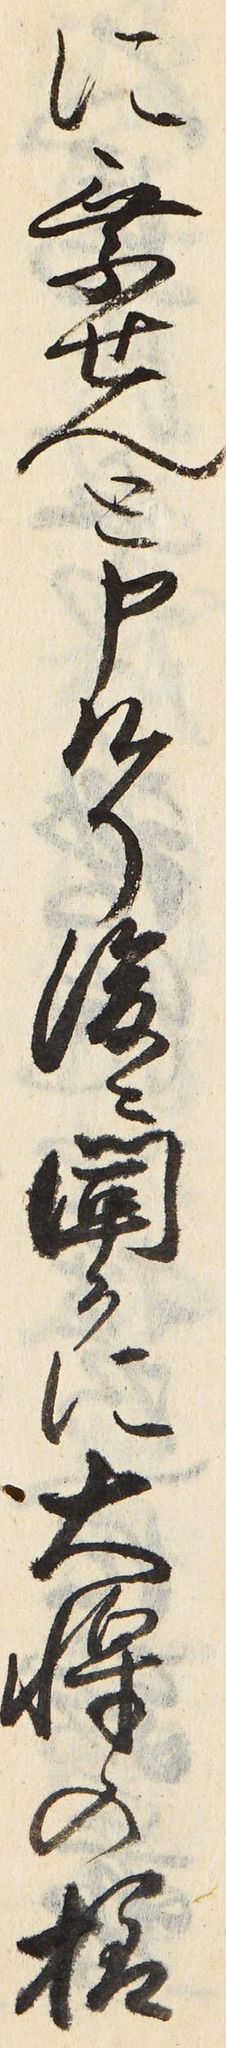に乗せんと申けり後に聞くに大将の様
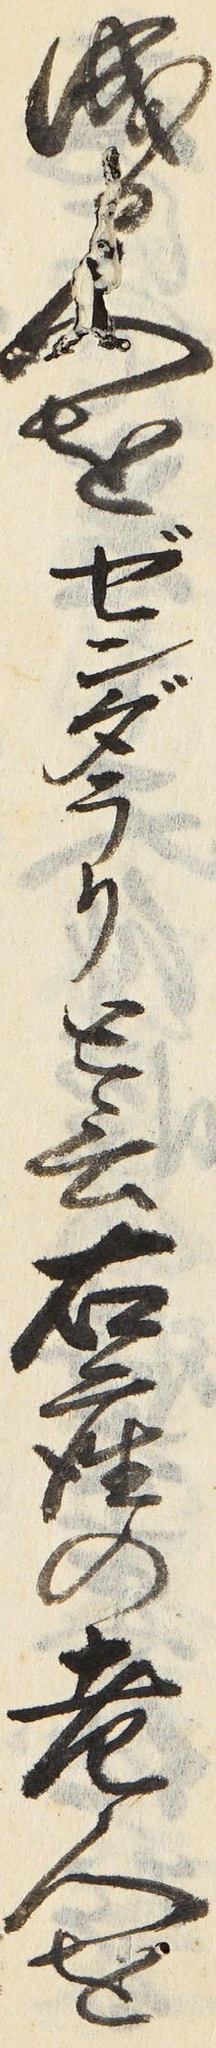成る人をゼンダラリと云右座の老人を
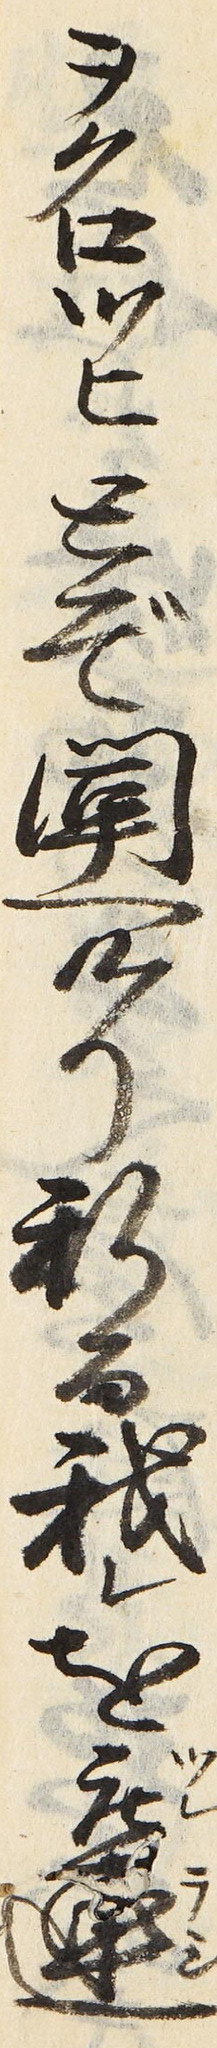ヲクロツヒとぞ聞へけり斯而我れを被連
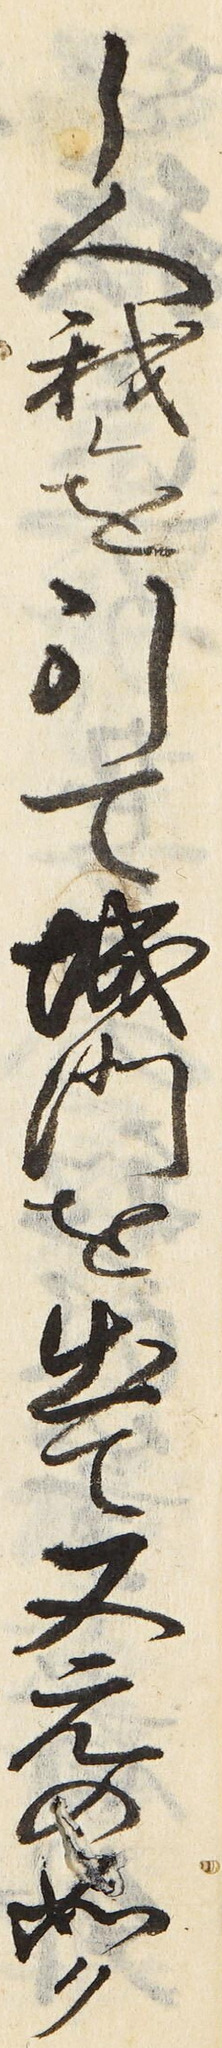し人我れを引て城門を出て又元の如く
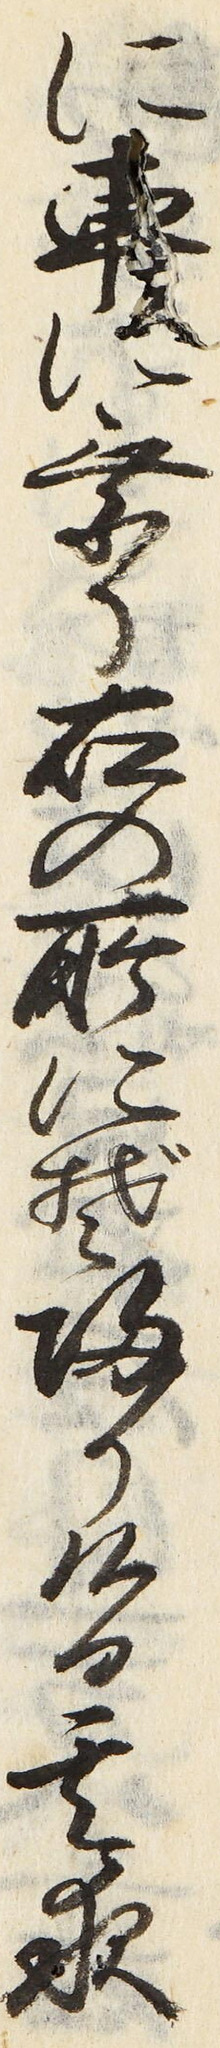に車に乗り右の所にぞ帰りける其夜
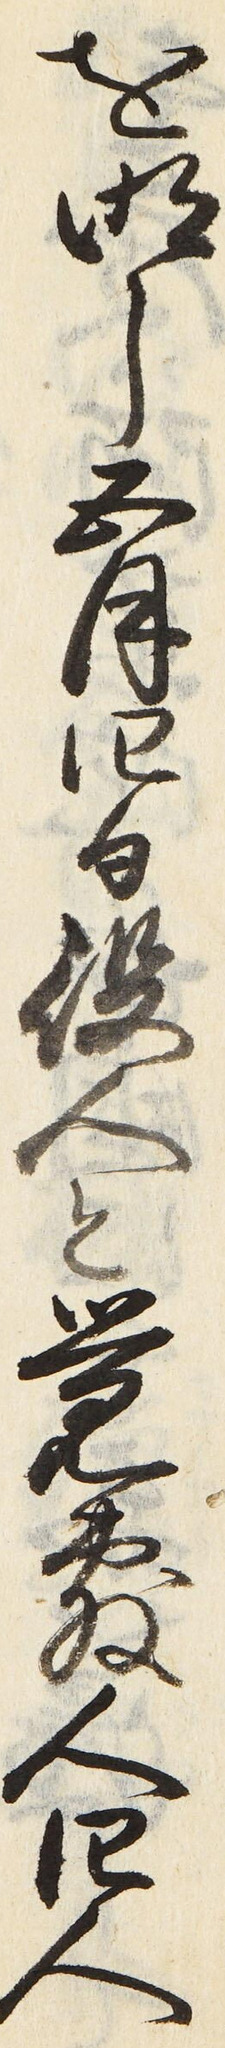を明し五月四日役人と覚敷人四人
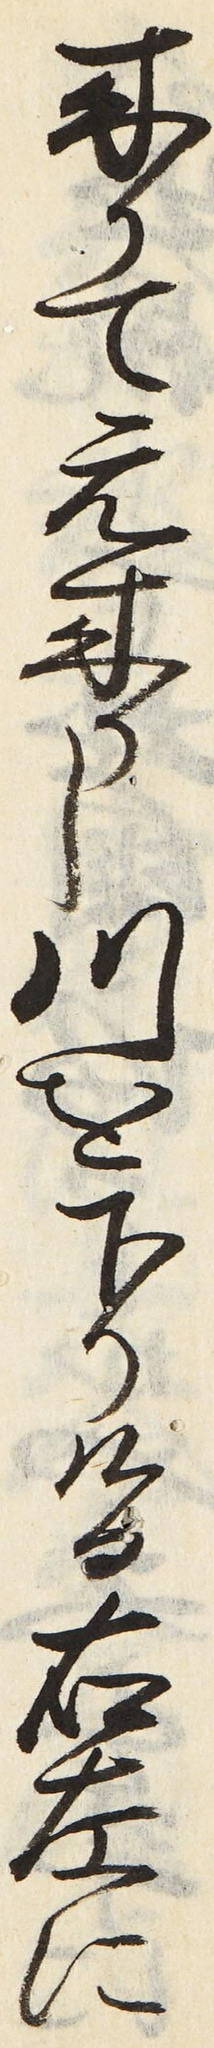来りて元来りし川を下りける右左に
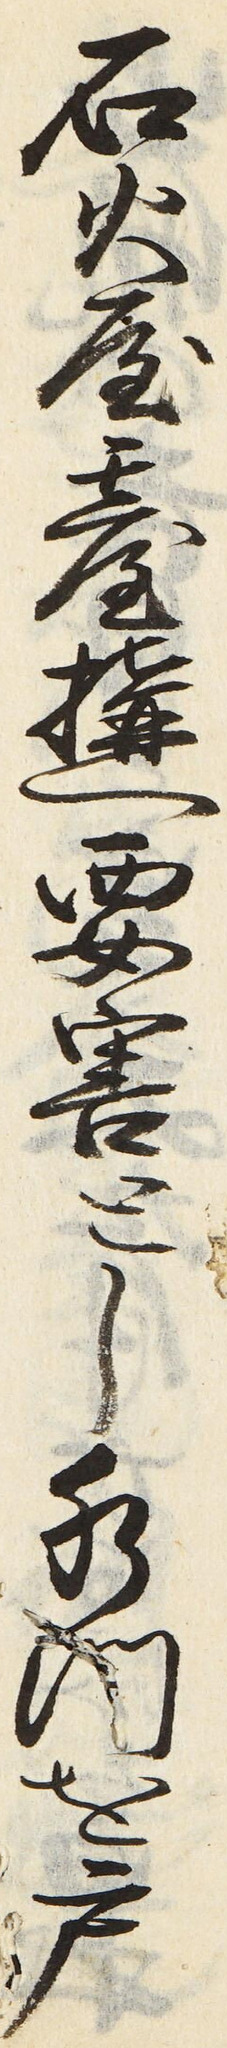石火屋台構へ要害とし水門を戸
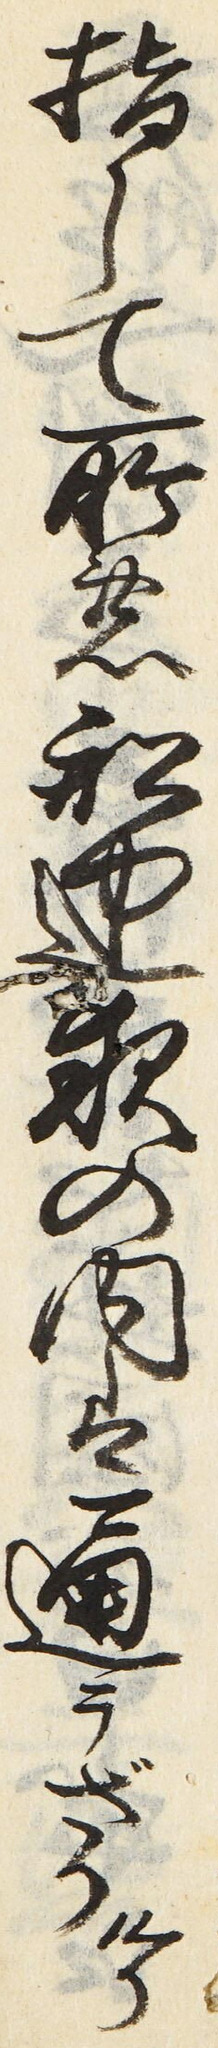指して所の船迚夜の内は通らざりけり
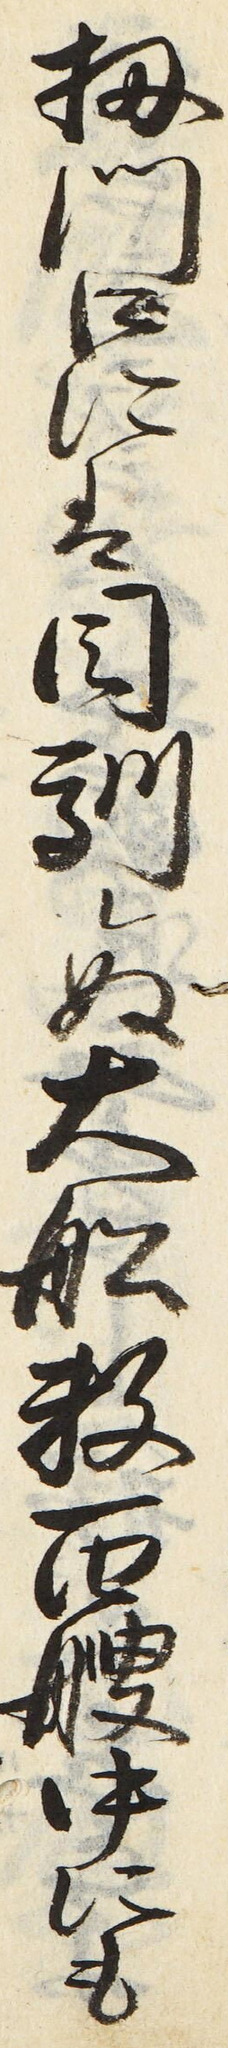扨門口には目馴れぬ大船数百艘中にも
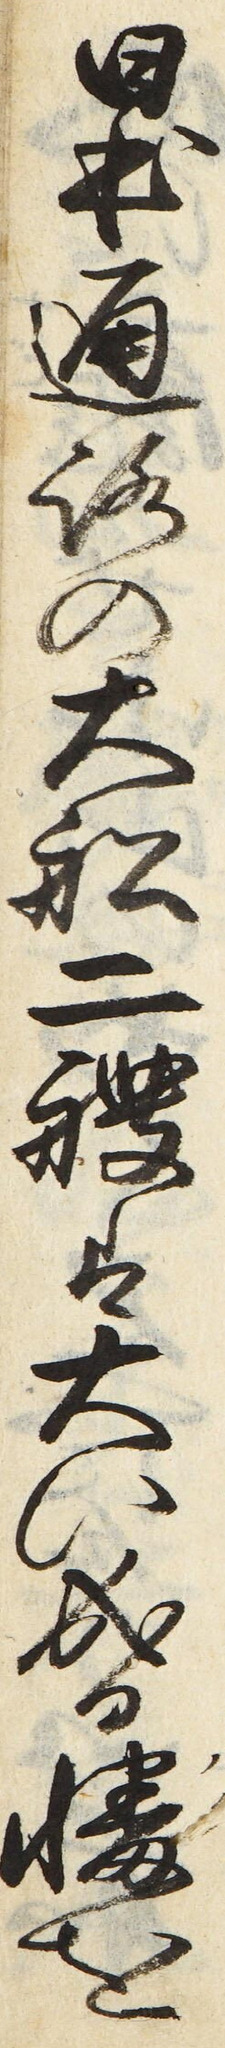日本通路の大船二艘は大ひ成る幡を

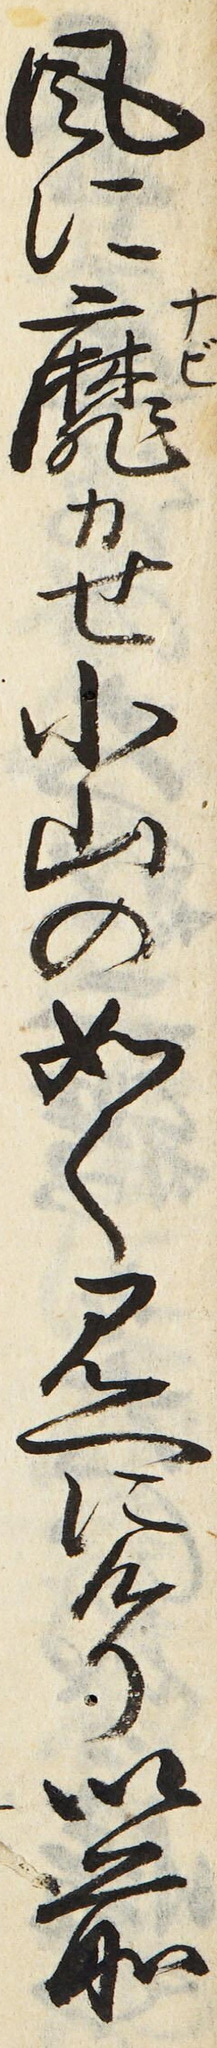風に靡かせ小山の如く見へにけり以前
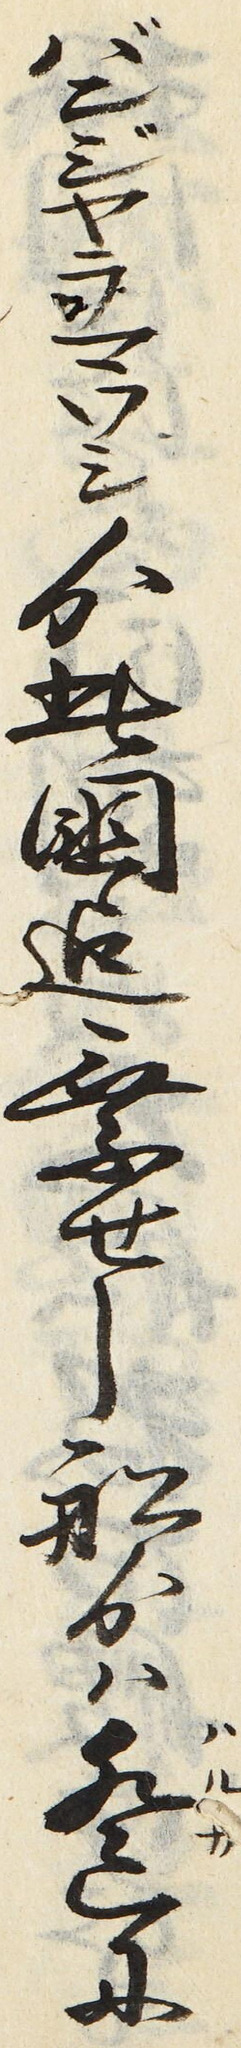バンジヤラマワシゟ此国迠乗せし船ゟは遥に
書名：華夷九年録
